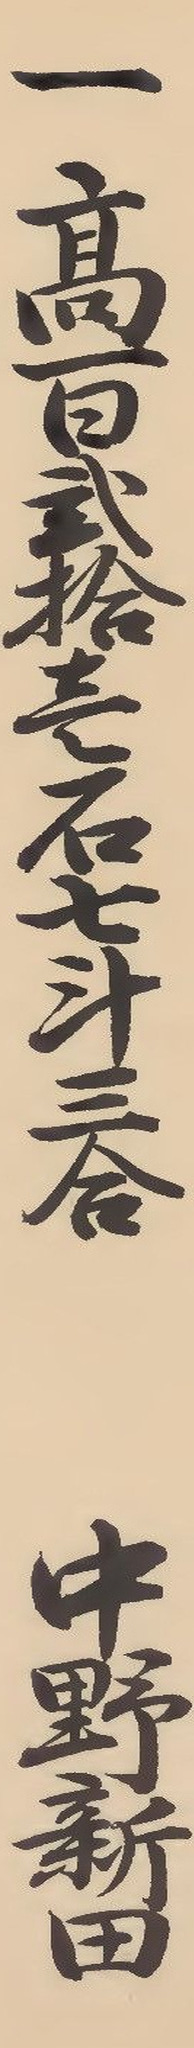一高百弐拾壱石七斗三合中野新田
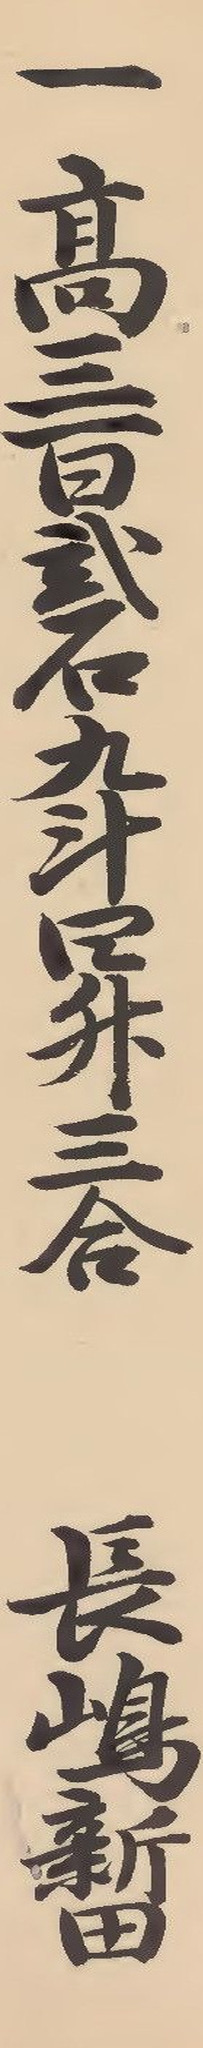一高三百弐石九斗四升三合長島新田
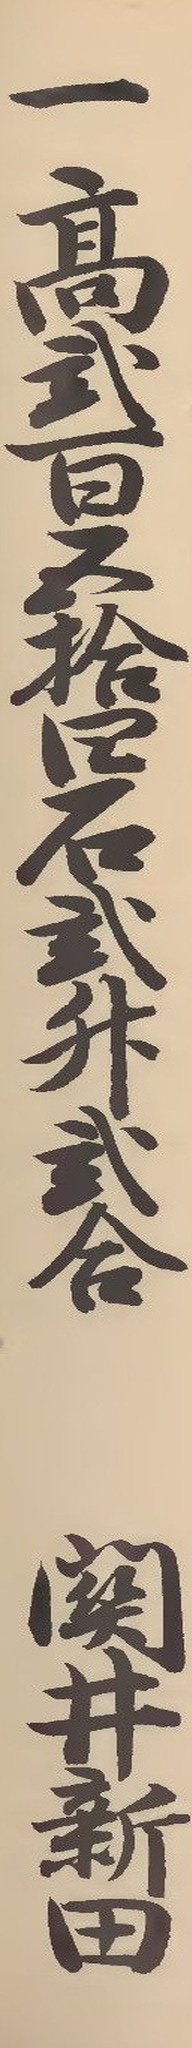一高弐百五拾四石弐升弐合関井新田
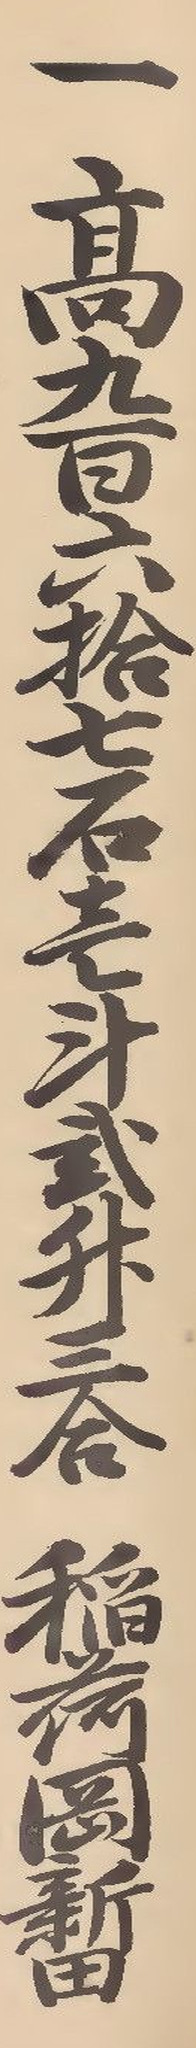一高九百六拾七石壱斗弐升三合稲荷岡新田
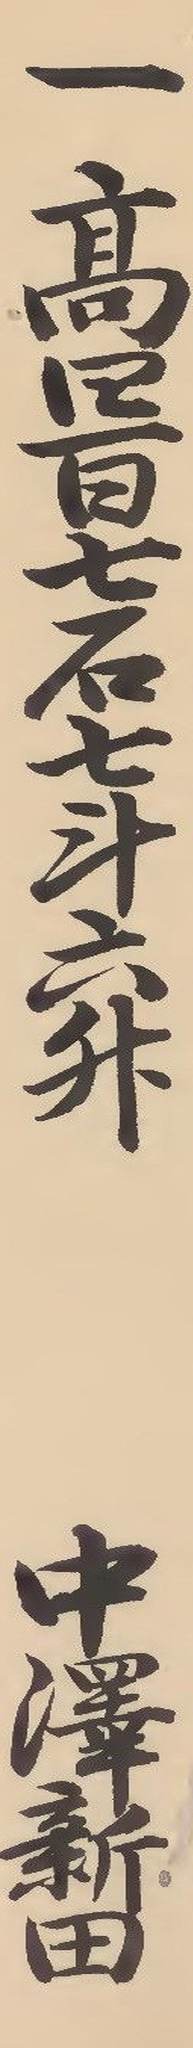一高四百七石七斗六升中沢新田
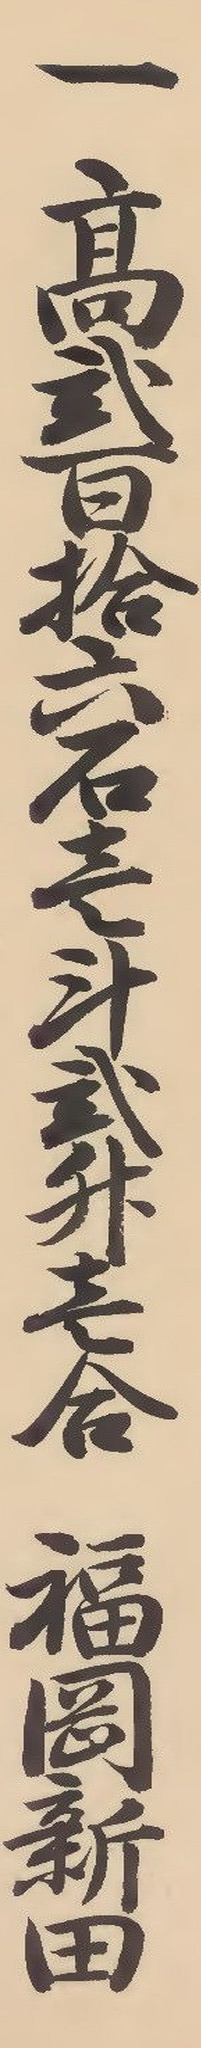一高弐百拾六石壱斗弐升壱合福岡新田
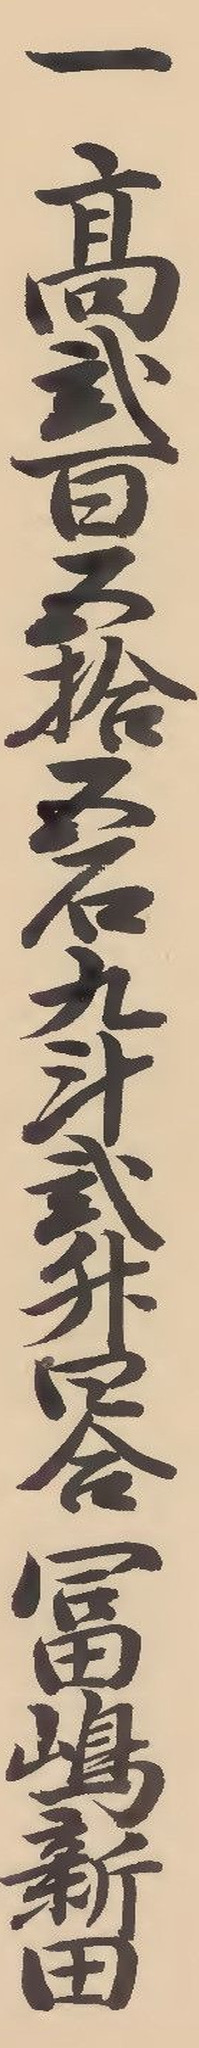一高弐百五拾五石九斗弐升四合富島新田

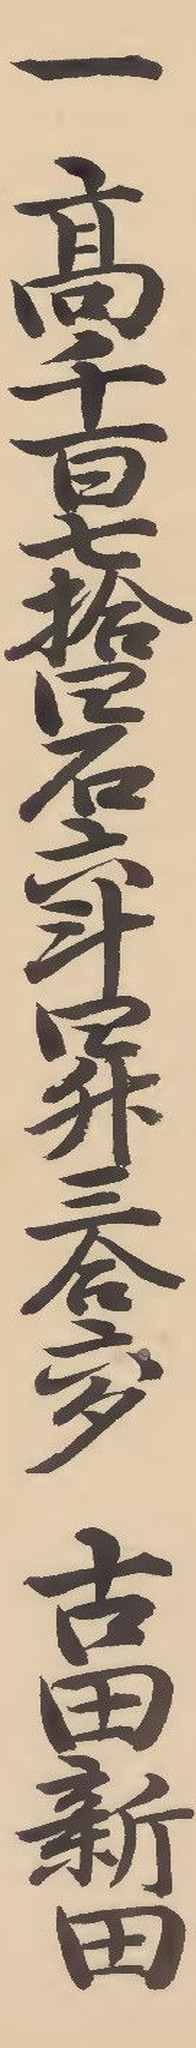一高千百七拾四石六斗四升三合六勺古田新田
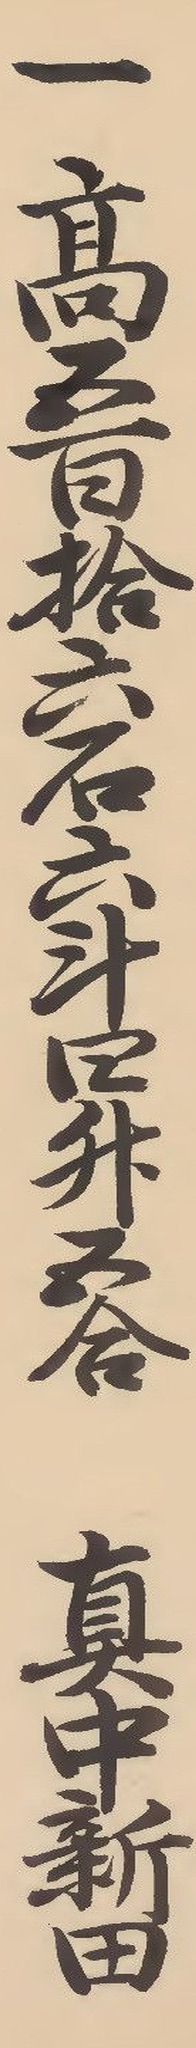一高五百拾六石六斗四升五合真中新田
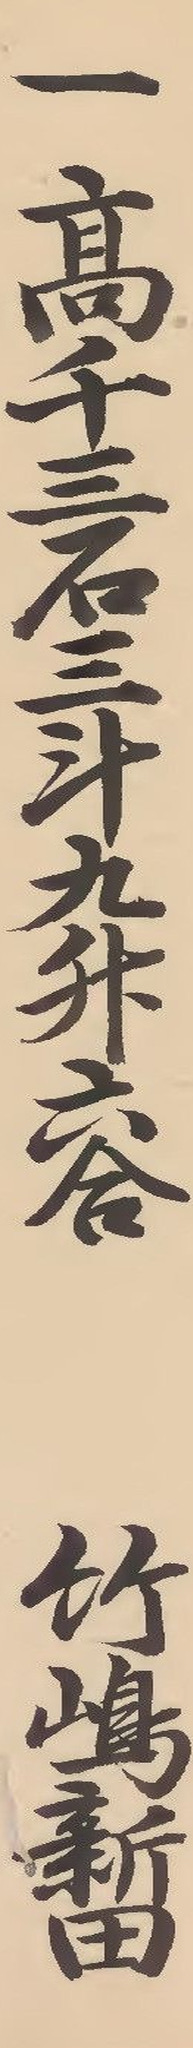一高千三石三斗九升六合竹島新田
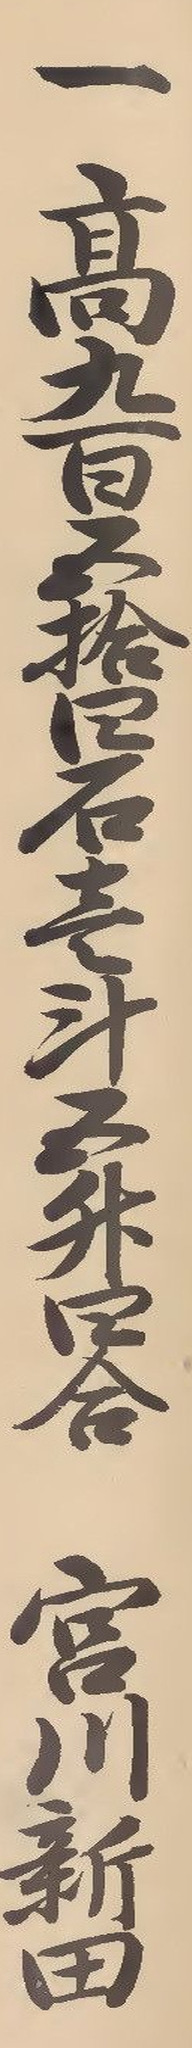一高九百五拾四石壱斗五升四合宮川新田
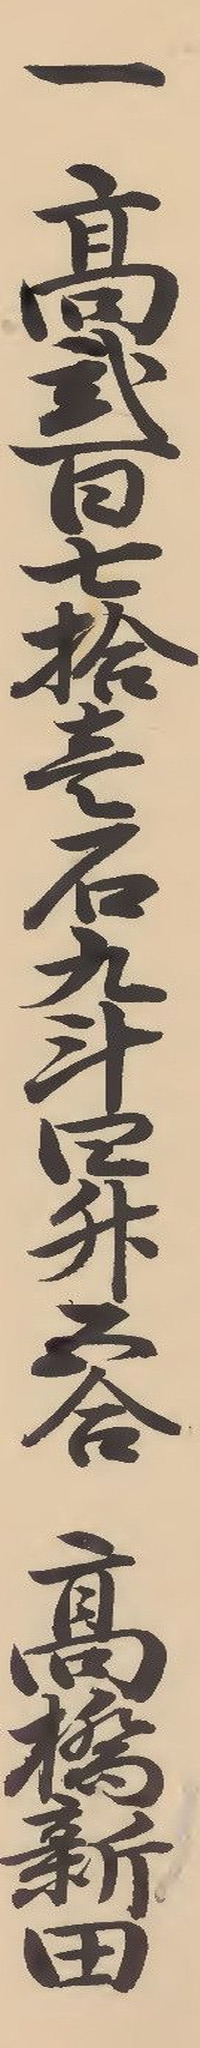一高弐百七拾壱石九斗四升五合高橋新田
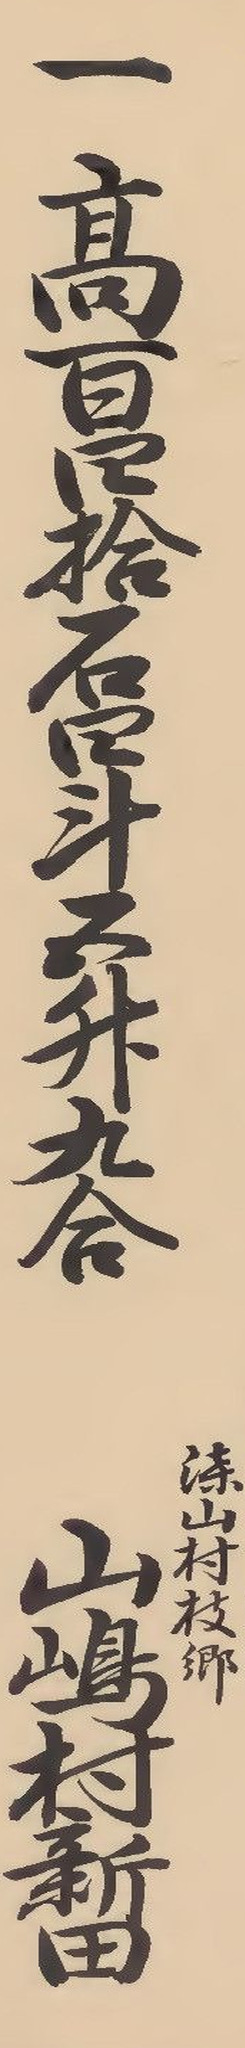一高百四拾石四斗五升九合山島村新田
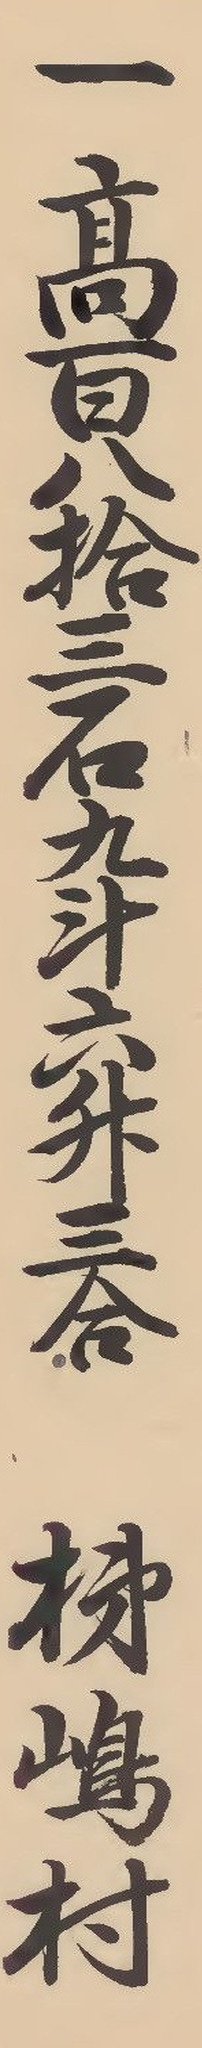一高百八拾三石九斗六升三合柿島村

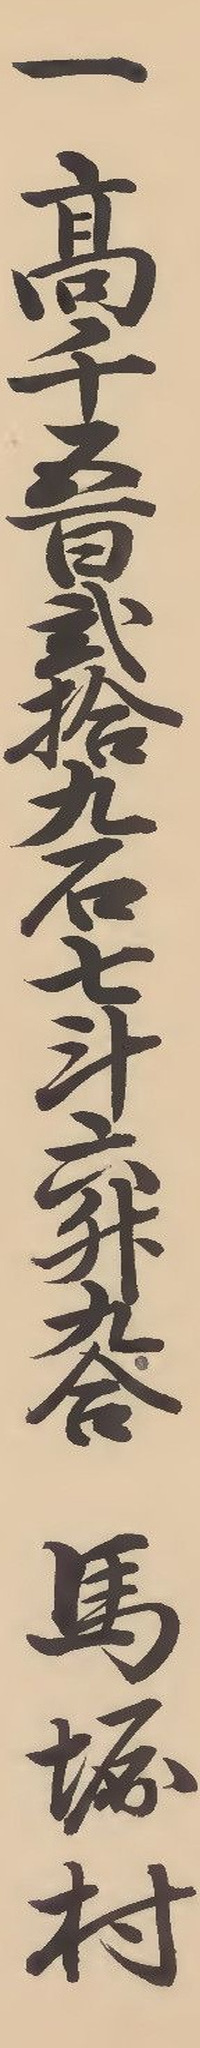一高千五百弐拾九石七斗六升九合馬堀村
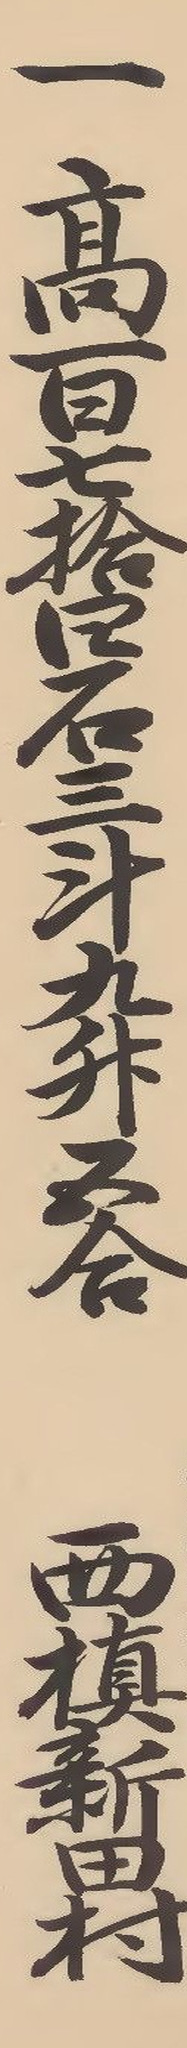一高百七拾四石三斗九升五合西槙新田村
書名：越後国郷帳　下
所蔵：国立公文書館 National Archives of Japan
